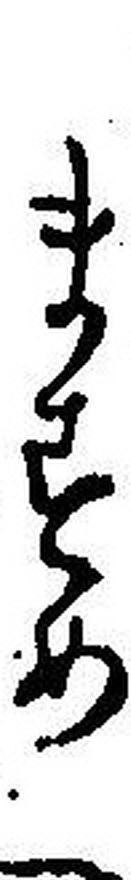ますめ
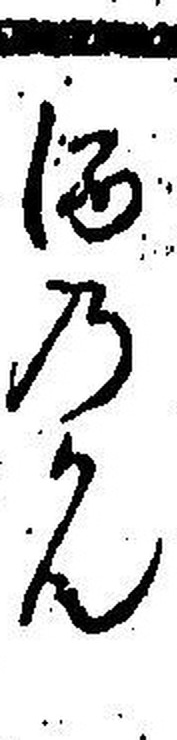酒のかん
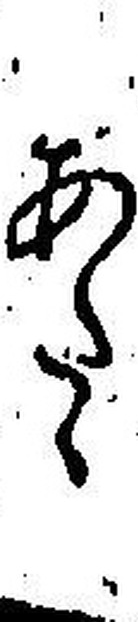あたゝ
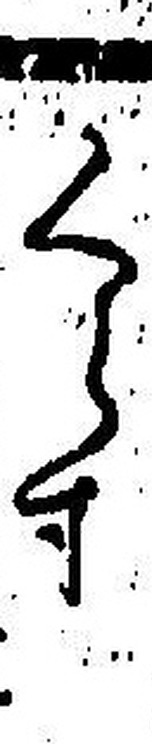くらすと
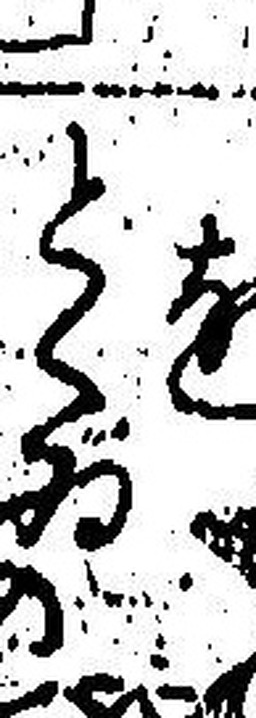とくゐの
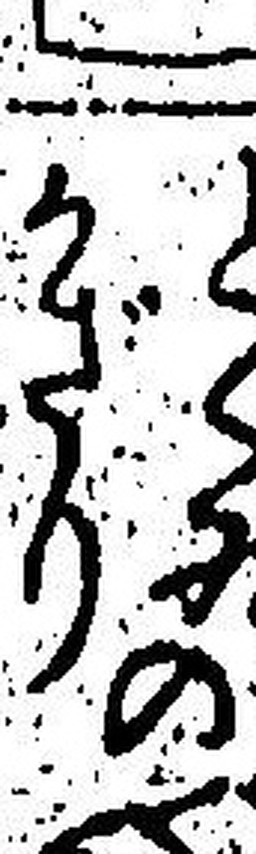かざり
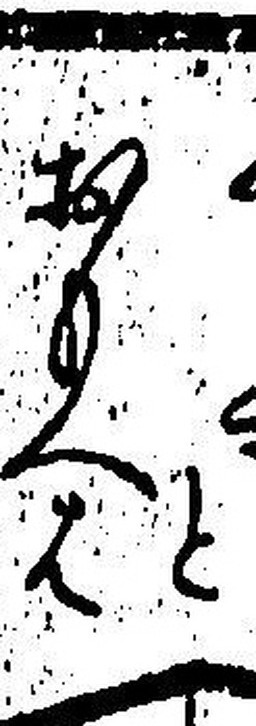おもへは
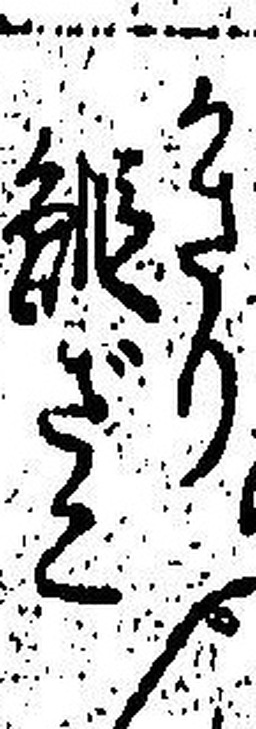鰕ざこ

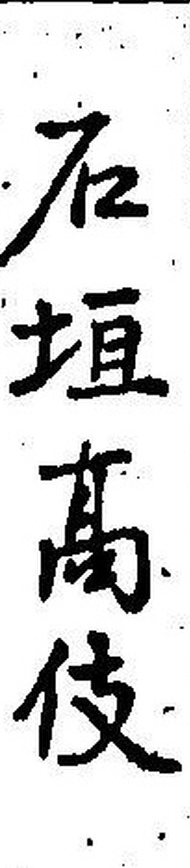石垣髙伎
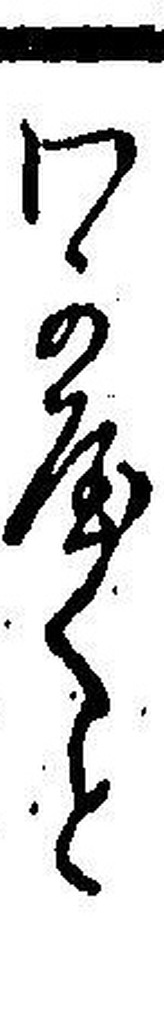わかやくと
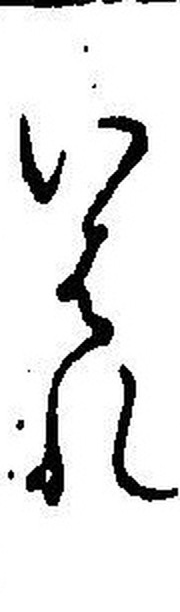いはれ
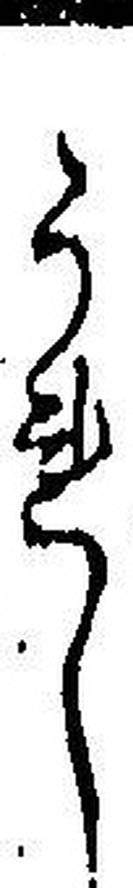うれし
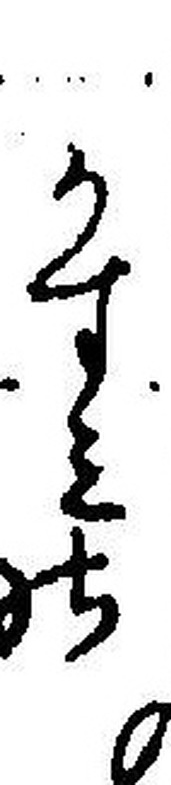かゝみの
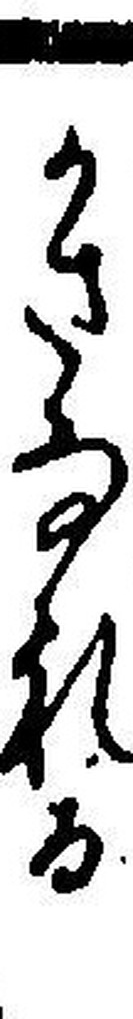かさなれる
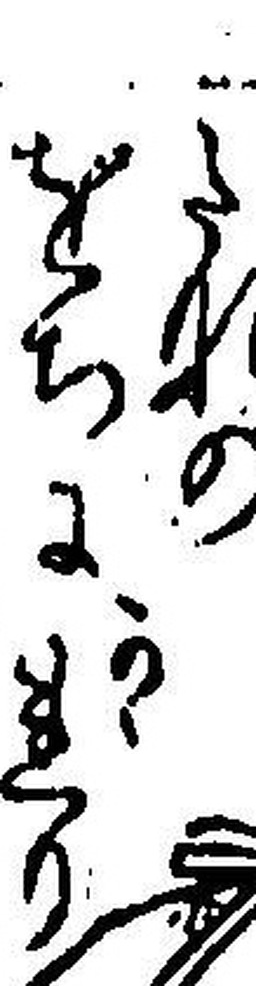をちにかゝ
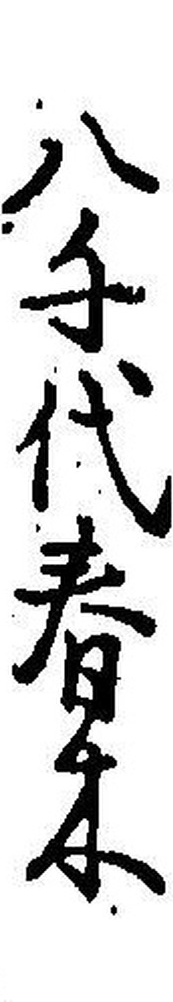八千代春木
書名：どうれ百人一首 / 鹿都部真顔(狂歌堂)編
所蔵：東京大学総合図書館 General Library in the University of Tokyo, JAPAN
